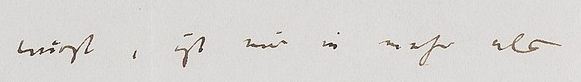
wirst, ist mir in mehr als
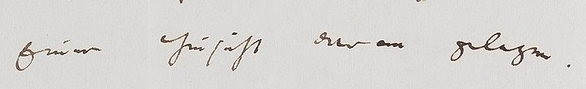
Einer Hinsicht daran gelegen.
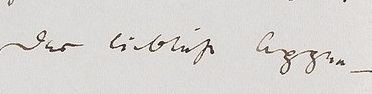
Das liebliche Appen-
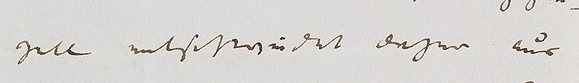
zell entschwindet daher aus
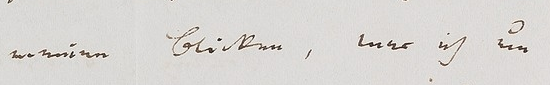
meinen Blicken, was ich um-
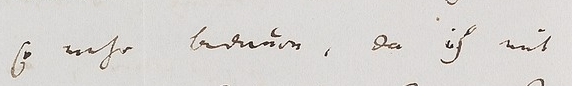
so mehr bedaure, da ich mit
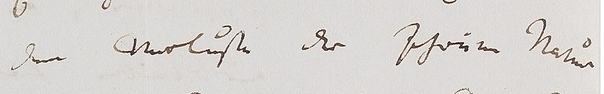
dem Verluste der schönen Natur
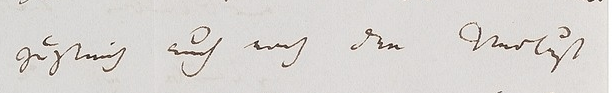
zugleich auch noch den Verlust
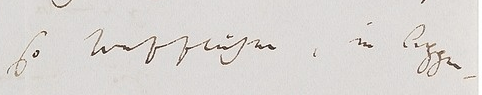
so trefflichen, in Appen-
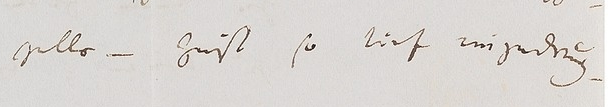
zells – Geist so tief eingedrung-
